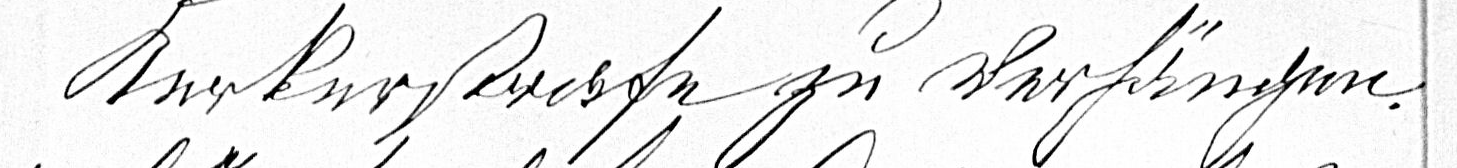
Kerkerstrafe zu verhängen.
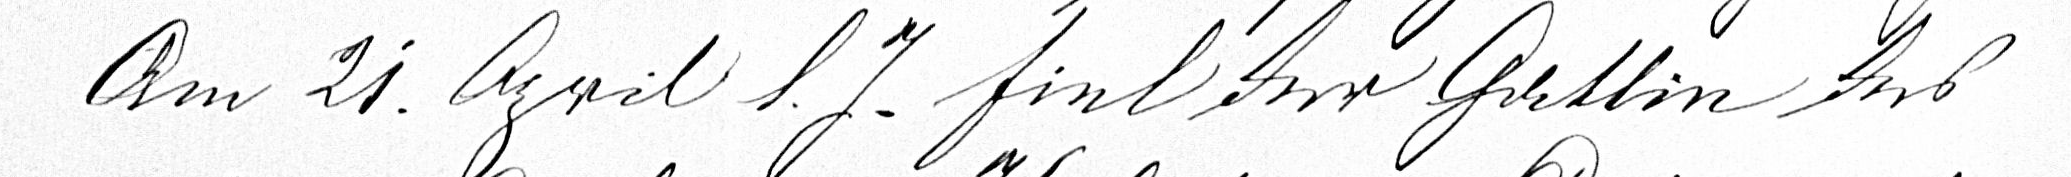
Am 21. April l. J. fiel der Gattin des
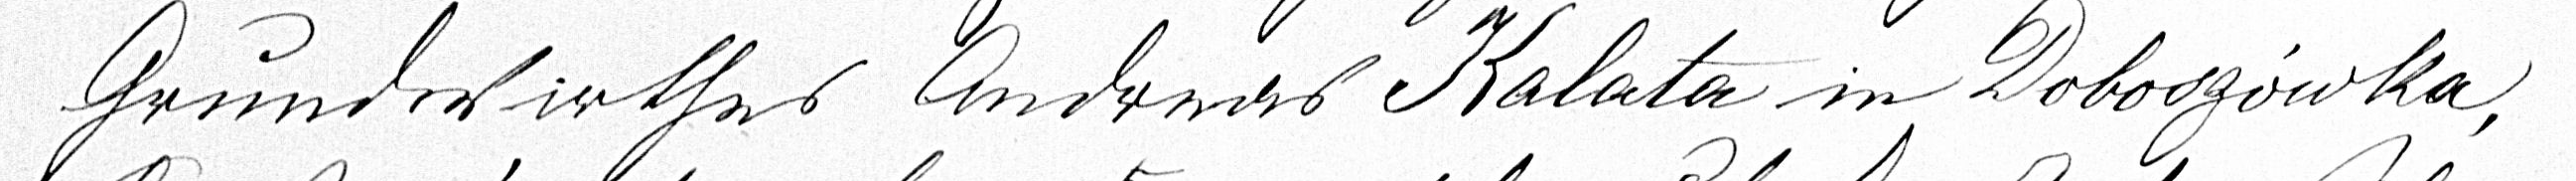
Grundwirthes Andreas Kalata in Doboszówka,
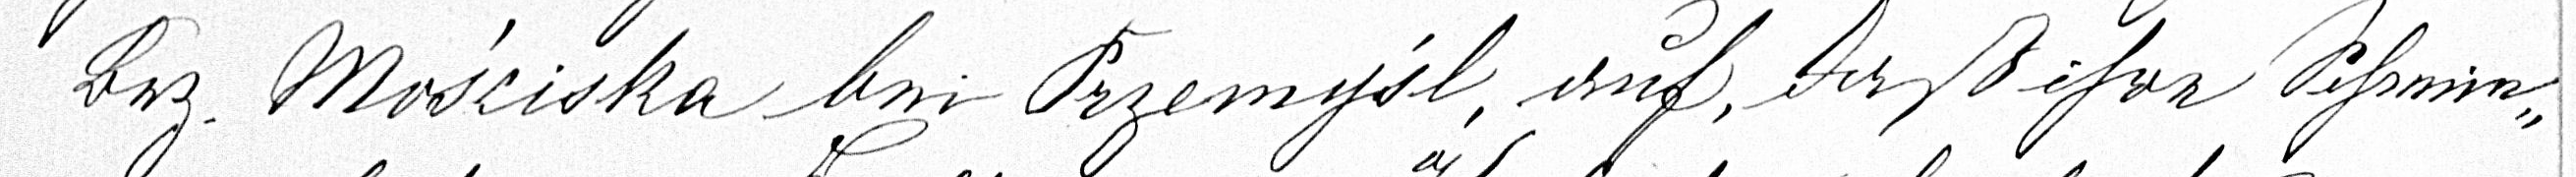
Bez. Mościska bei Przemyśl, auf, daß ihre Schwie¬
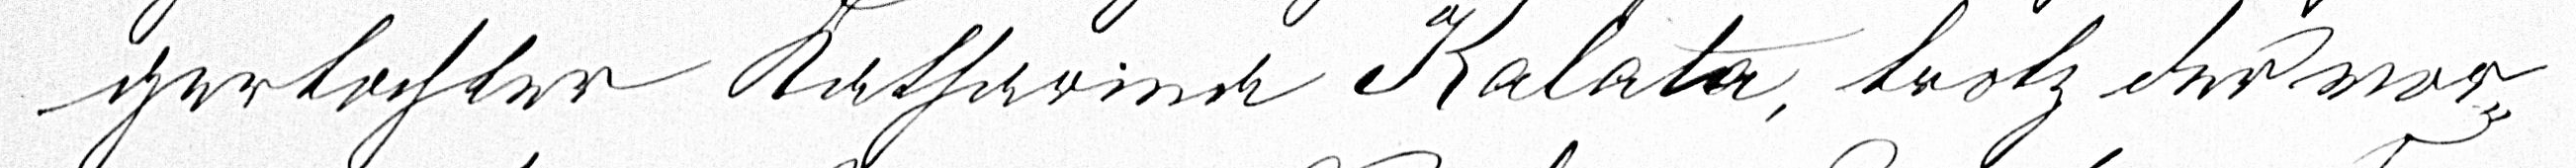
gertochter Katharina Kalata, trotz der vor¬
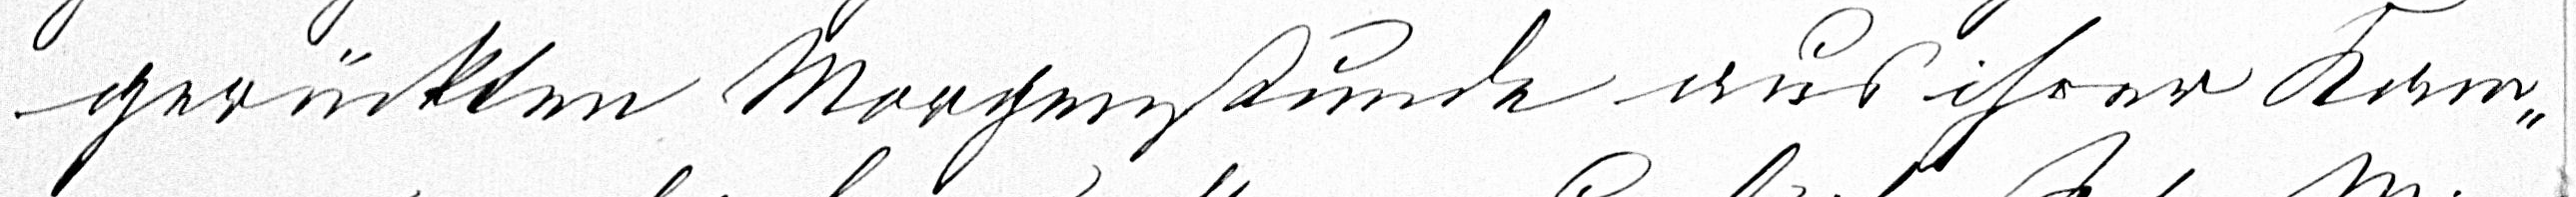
gerückten Morgenstunde aus ihrer Kam¬
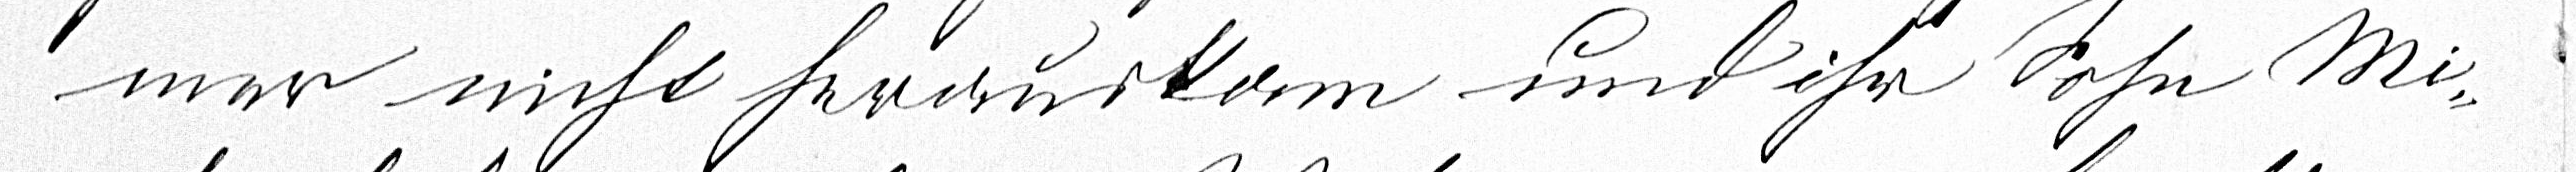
mer nicht herauskam und ihr Sohn Mi¬
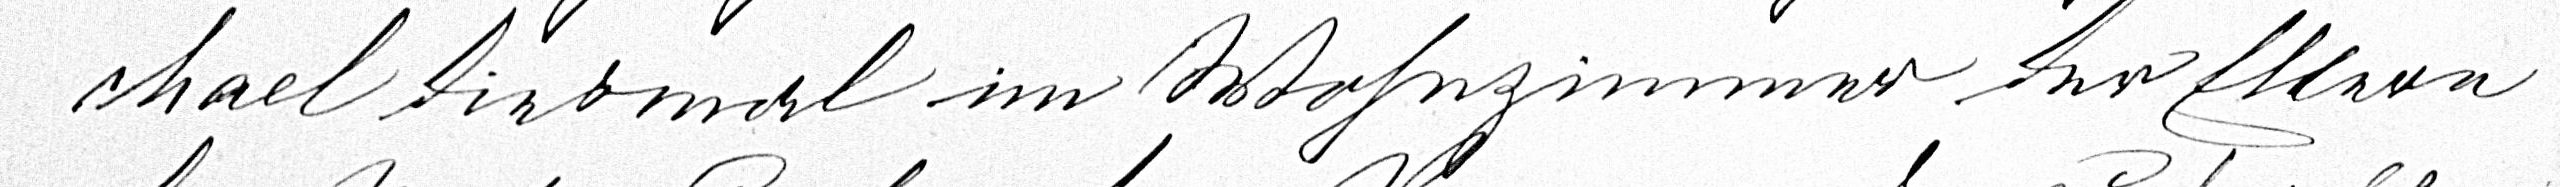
chael diesmal im Wohnzimmer der Eltern
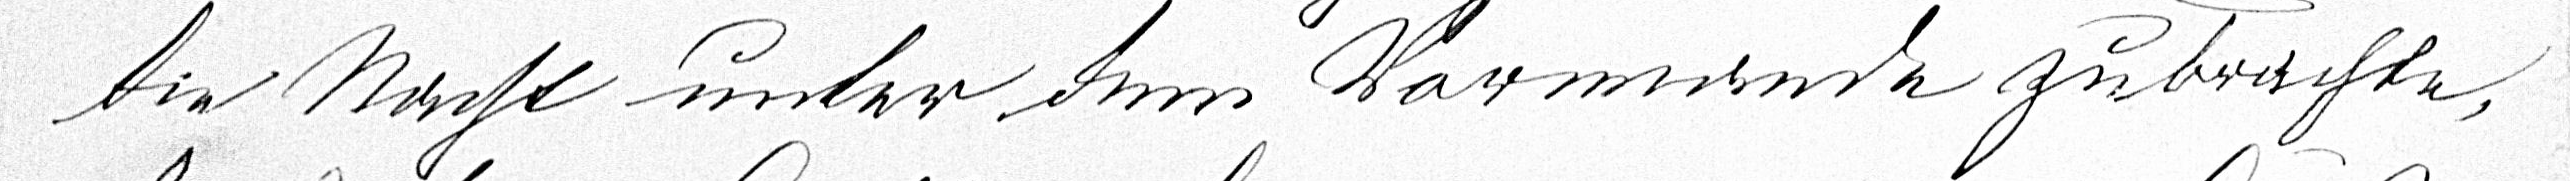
die Nacht unter dem Vorwande zubrachte,
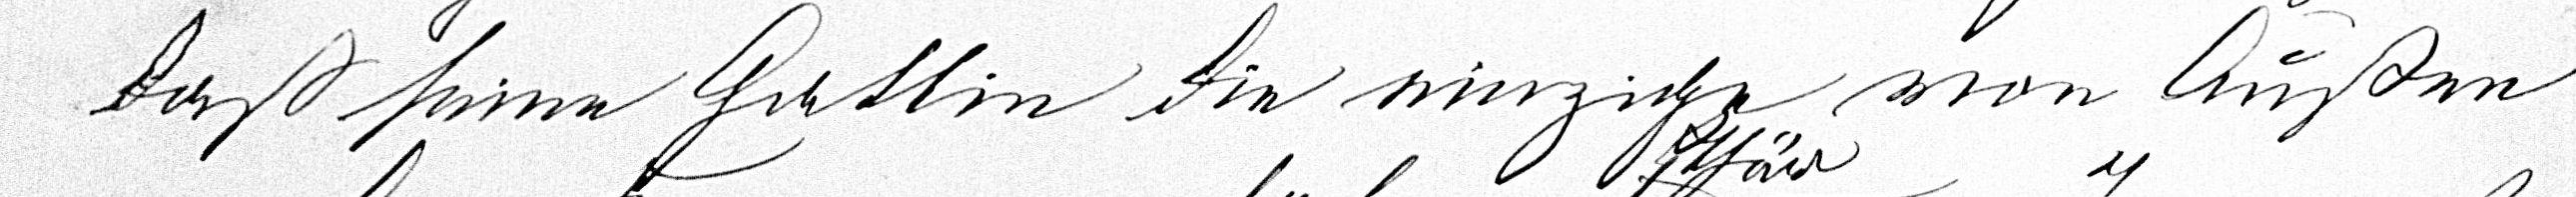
daß seine Gattin die einzige von Außen
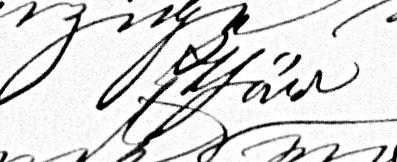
Thür
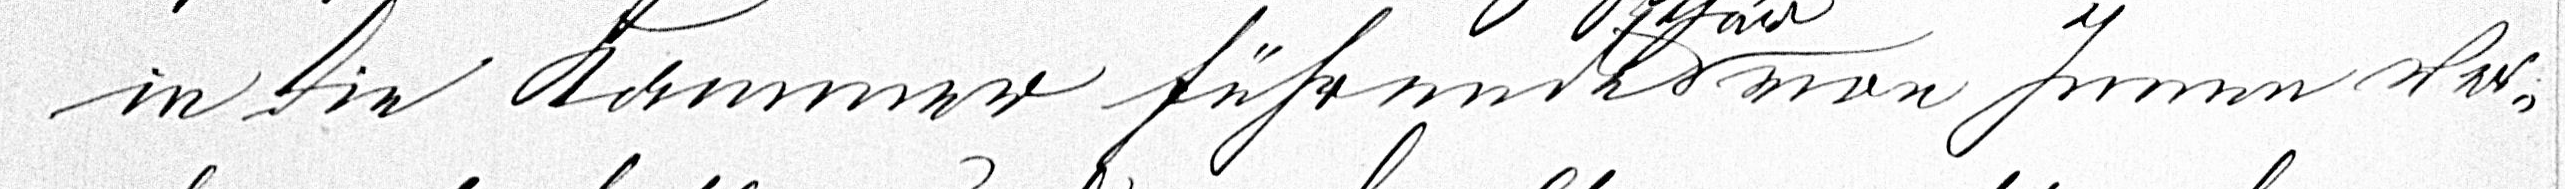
in die Kammer führende von Innen ver¬
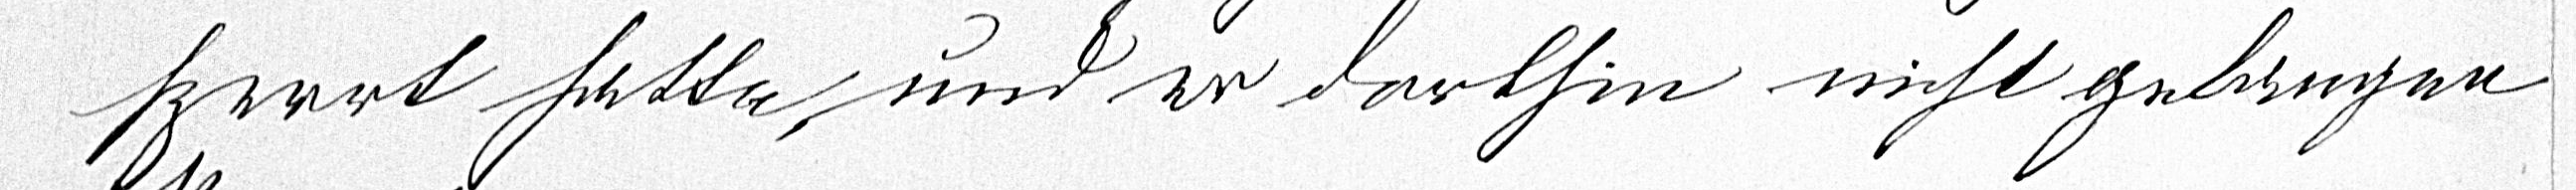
sperrt hatte, und er darthin nicht gelangen
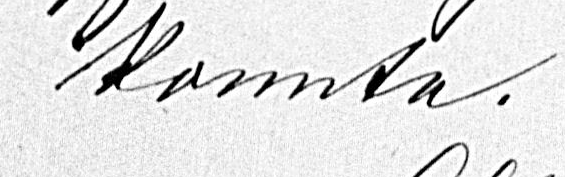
konnte.
